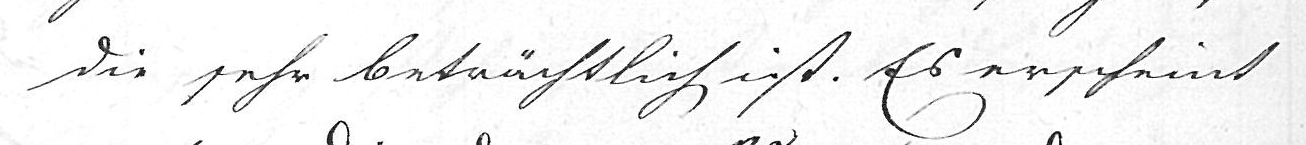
die sehr beträchtlich ist: Es erscheint
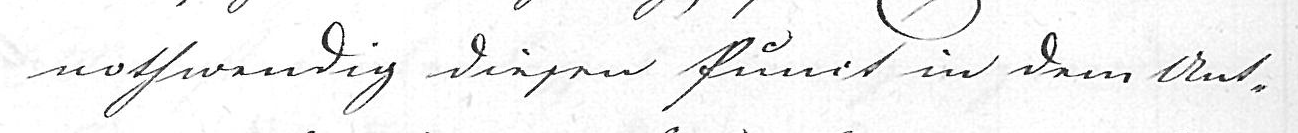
nothwendig diesen Puncte in dem Ant-
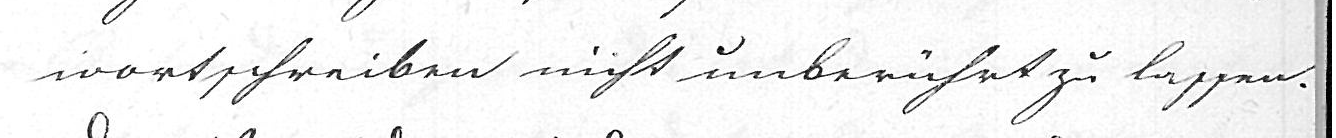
wortschreiben nicht unberührt zu lassen.
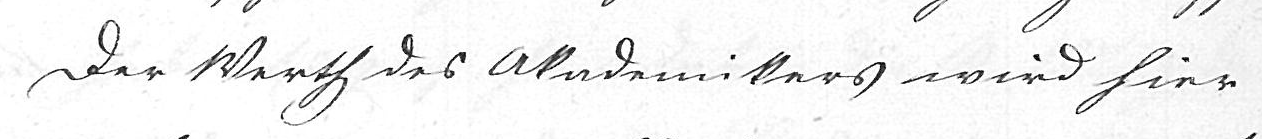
Der Werth des Akademiker wird hier
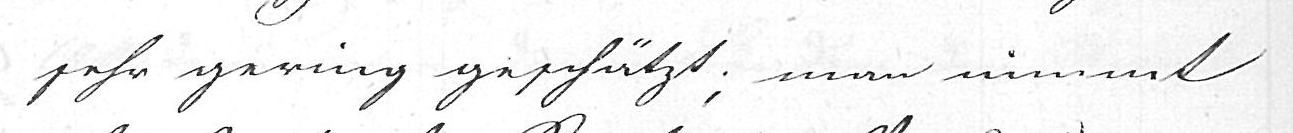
sehr gering geschätzt, man nimmt
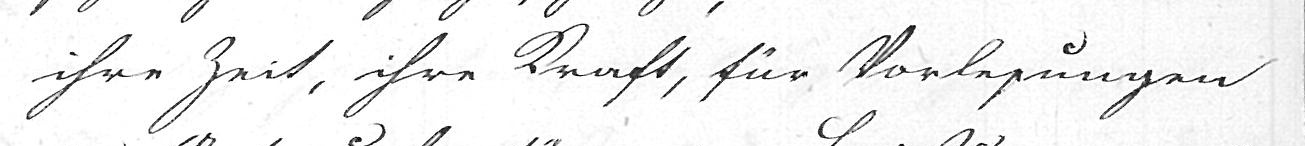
ihre Zeit, ihre Kraft, für Vorlesungen
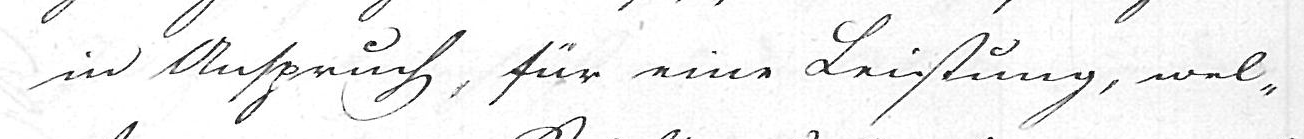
in Anspruch, für eine Leistung, wel-
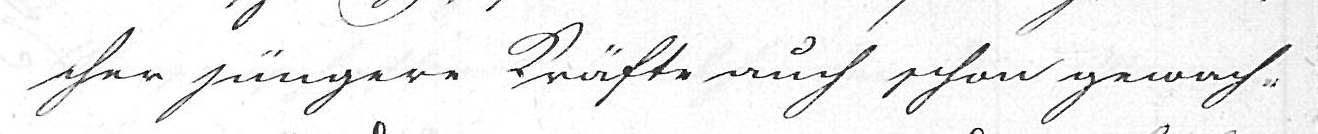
cher jüngere Kräfte auch schon gewach-
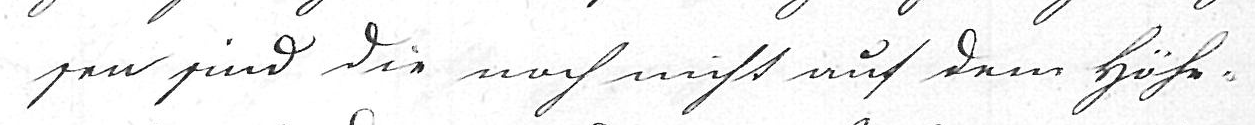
sen sind die noch nicht auf dem Höhe-
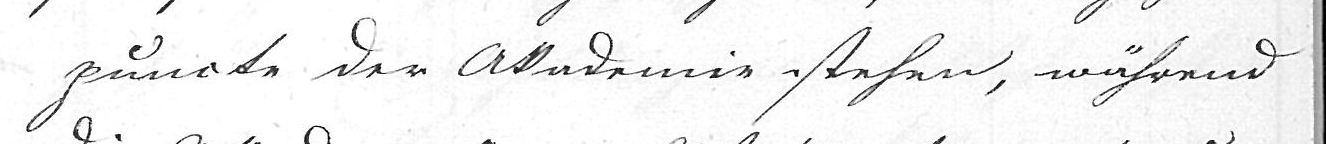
puncte der Akademie stehen, während
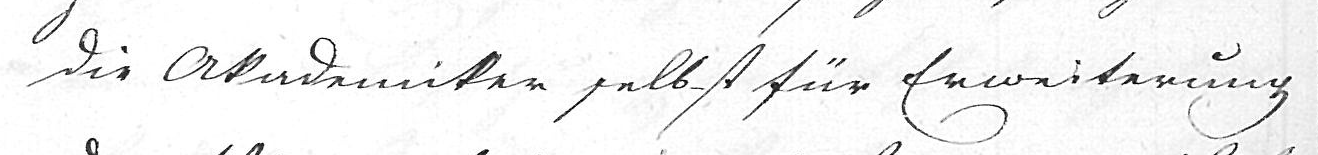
die Akademiker selbst für Erweiterung
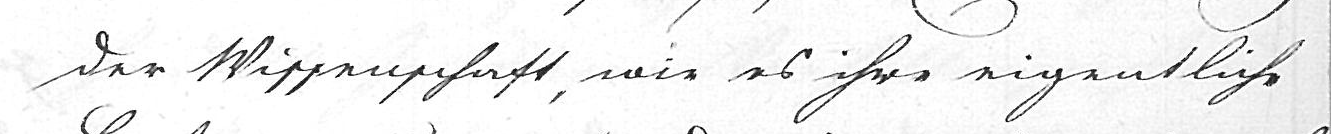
der Wissenschaft, wie es ihre eigentliche
